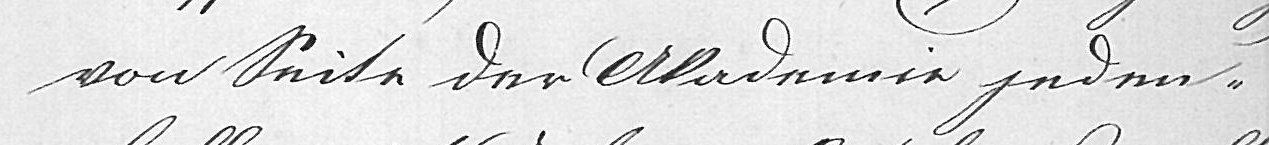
von Seite der Akademie jeden-
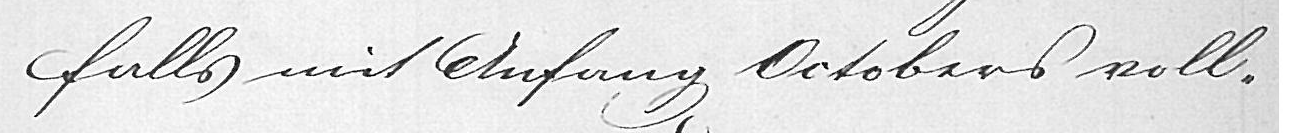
falls mit Anfang Octobers voll-
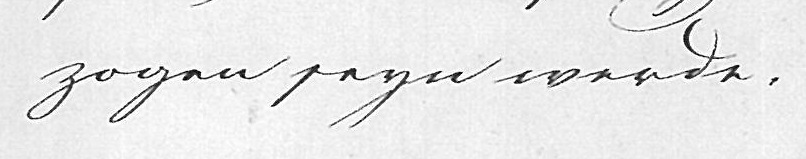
zogen seyn werde.
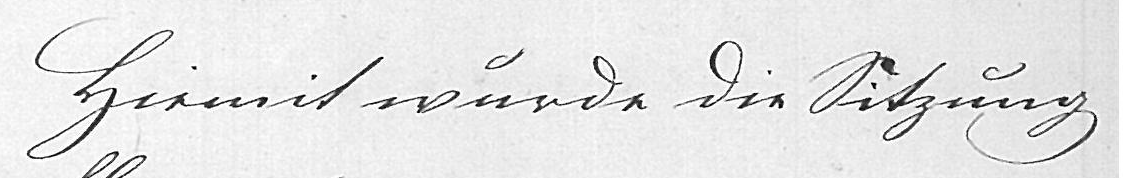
Hiemit wurde die Sitzung
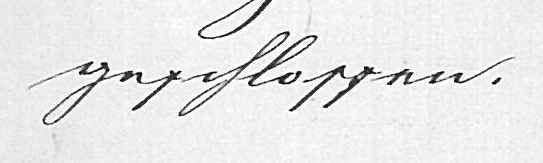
geschlossen.
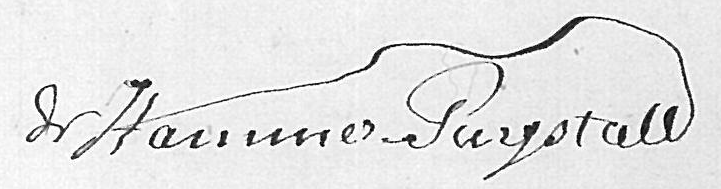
Dr. Hammer Purgstall
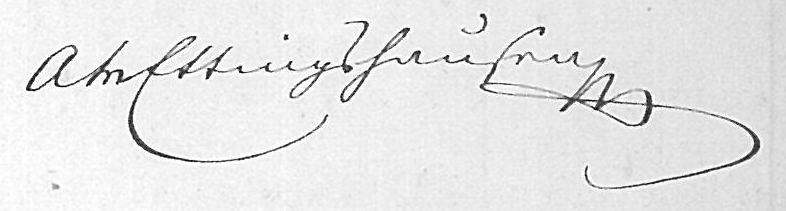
AvEttingshausen
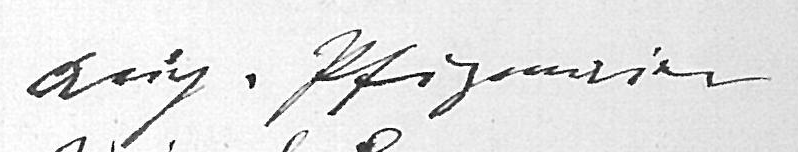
Aug. Pfizmaier
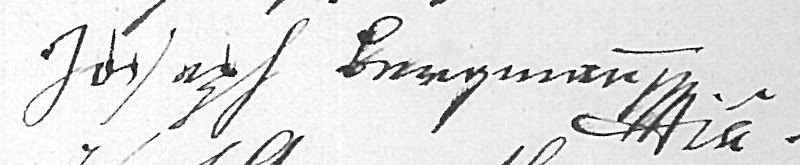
Joseph Bergmann
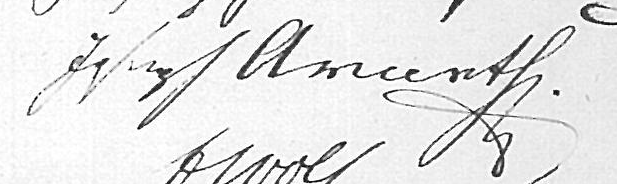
Joseph Arneth
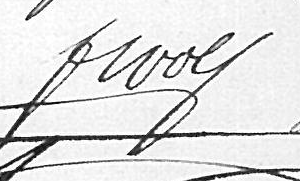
FWolf
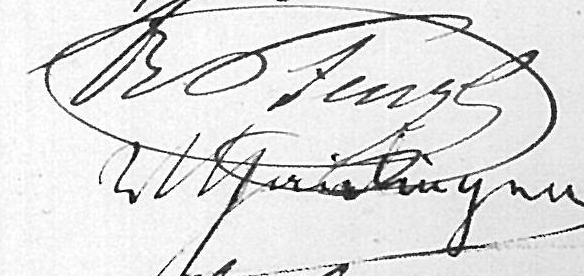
Ed. Fenzl
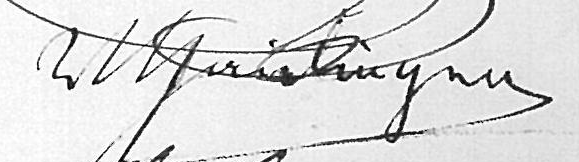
WHaidinger
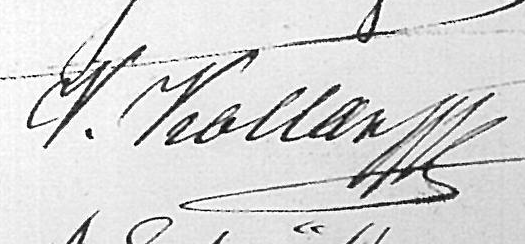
V. Kollar
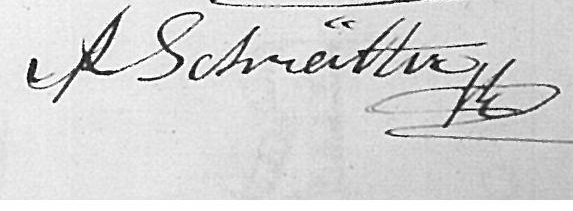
ASchrötter
